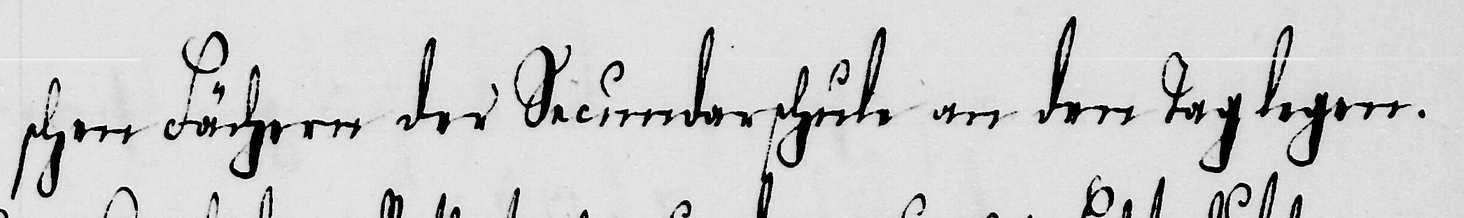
schen Fächern der Secundarschule an den Tag legen.
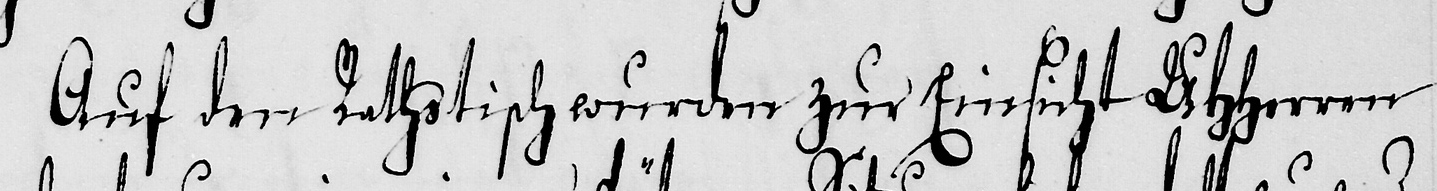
Auf den Rathstisch wurden zur Einsicht UHHerren
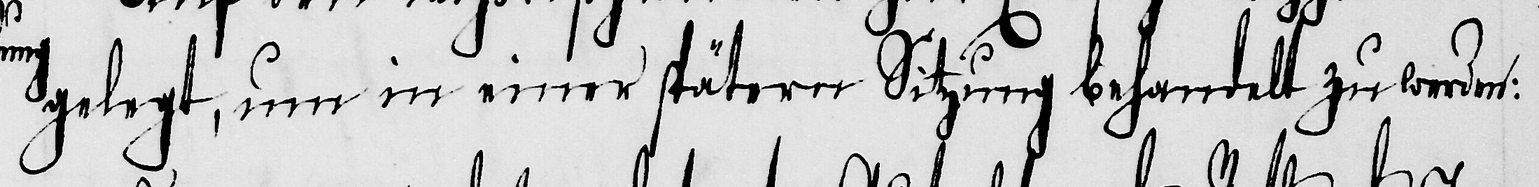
gelegt, um in einer spätern Sitzung behandelt zu werden:
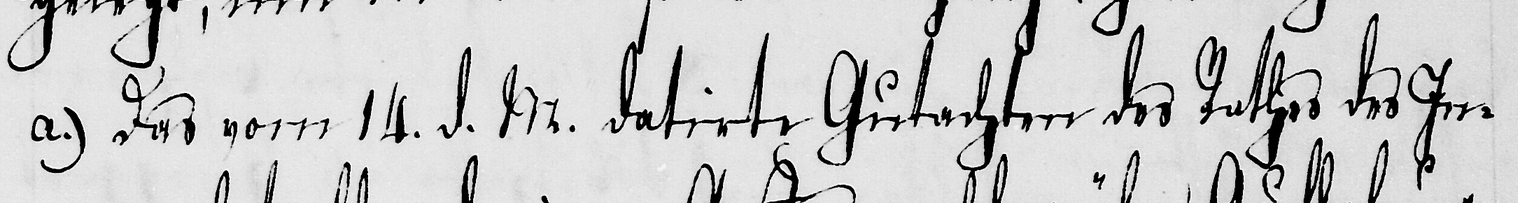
a.) Das vom 14. d. M. datirte Gutachten des Rathes des In¬
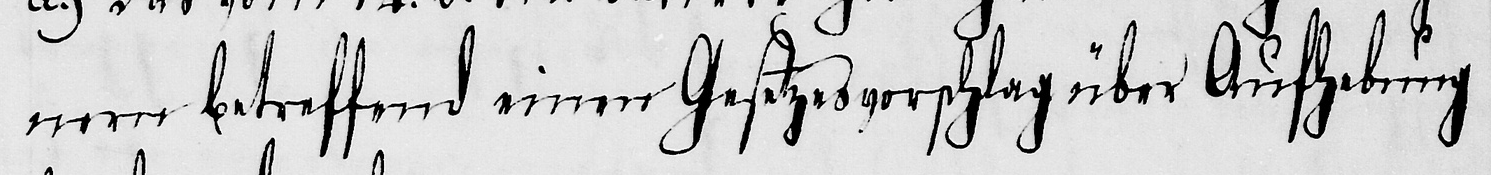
nern betreffend einen Gesetzesvorschlag über Aufhebung
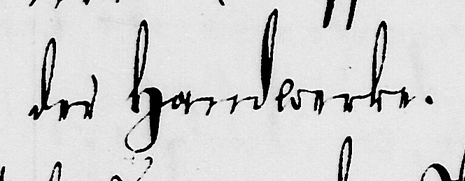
der Handwerke.
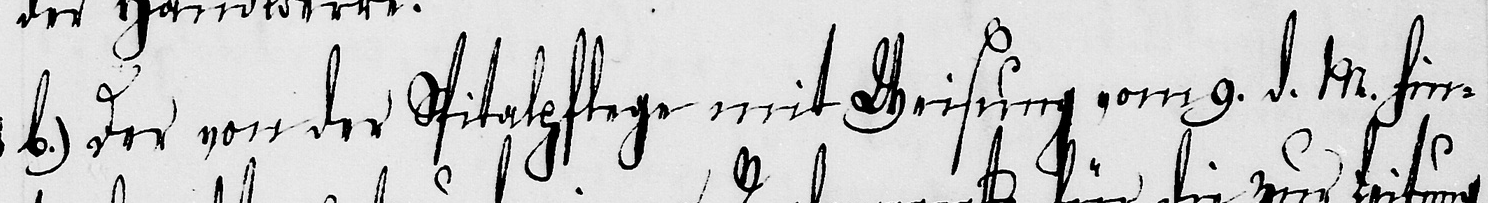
b.) Der von der Spitalpflege mit Weisung vom 9. d. M. hin¬
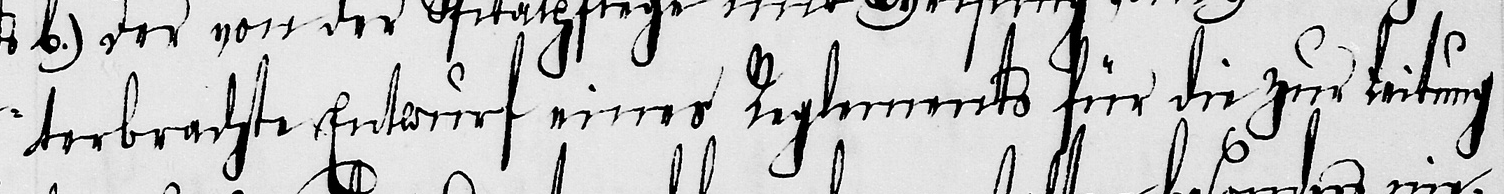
terbrachte Entwurf eines Reglements für die zur Leitung
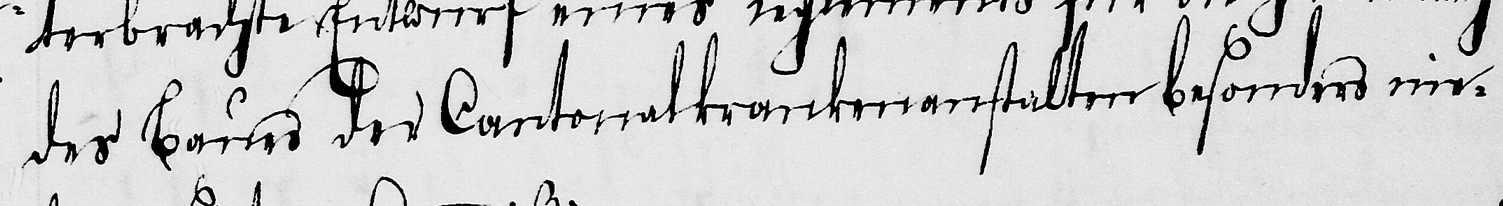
des Baues der Cantonalkrankenanstalten besonders nie¬
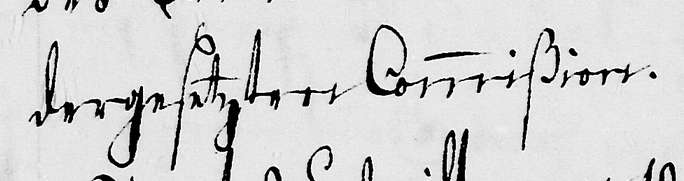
dergesetzten Commißion.
